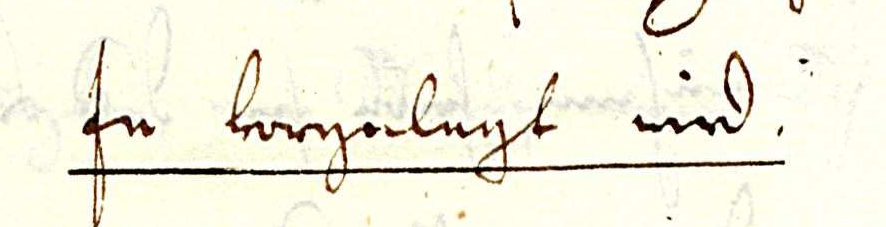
fe vorgelegt wird.
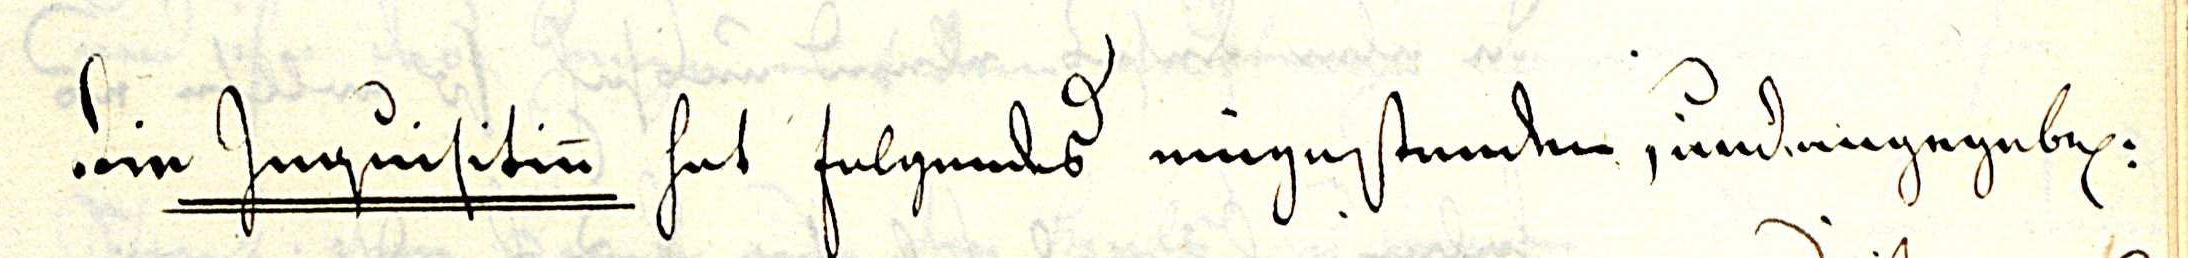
Die Inquisitin hat folgendes eingestanden, und angegeben:
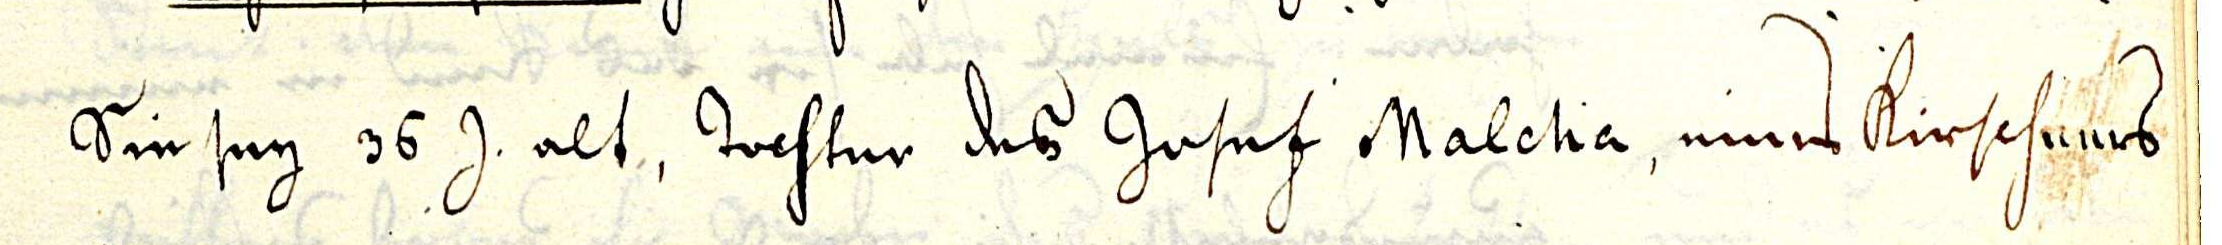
Sie sey 36 J. alt, Tochter des Josef Malcha, eines Kirschners
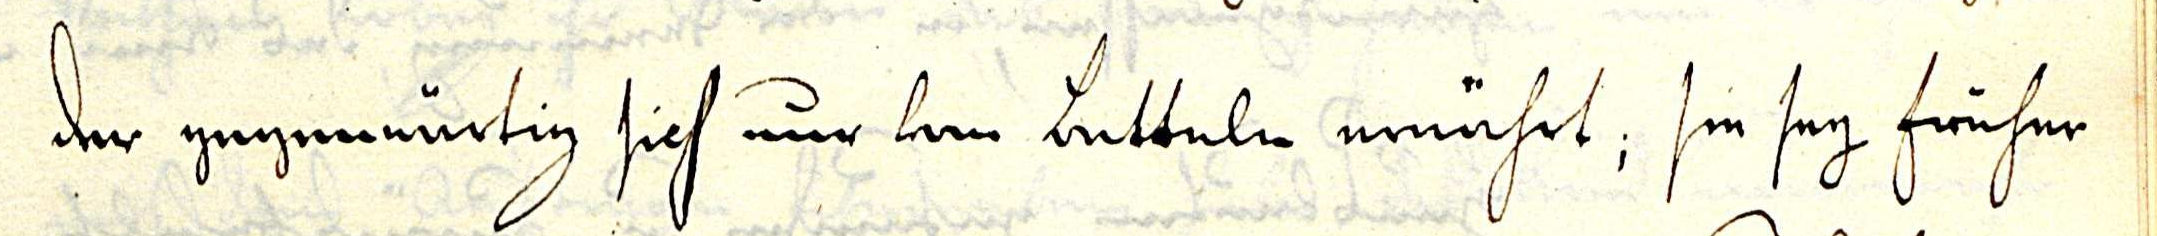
der gegenwärtig sich nur vom Betteln ernährt; sie sey früher
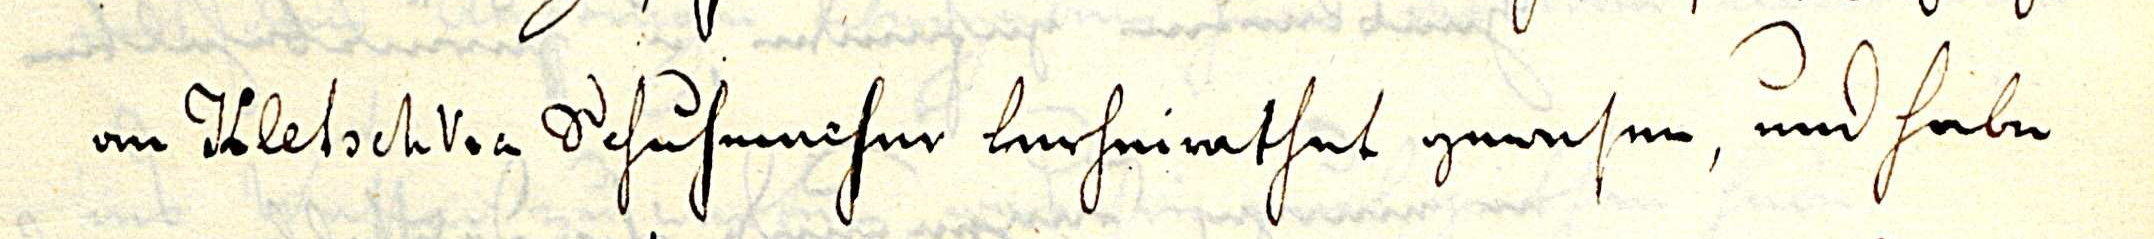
an Kletschka Schuhmacher verheirathet gewesen, und habe
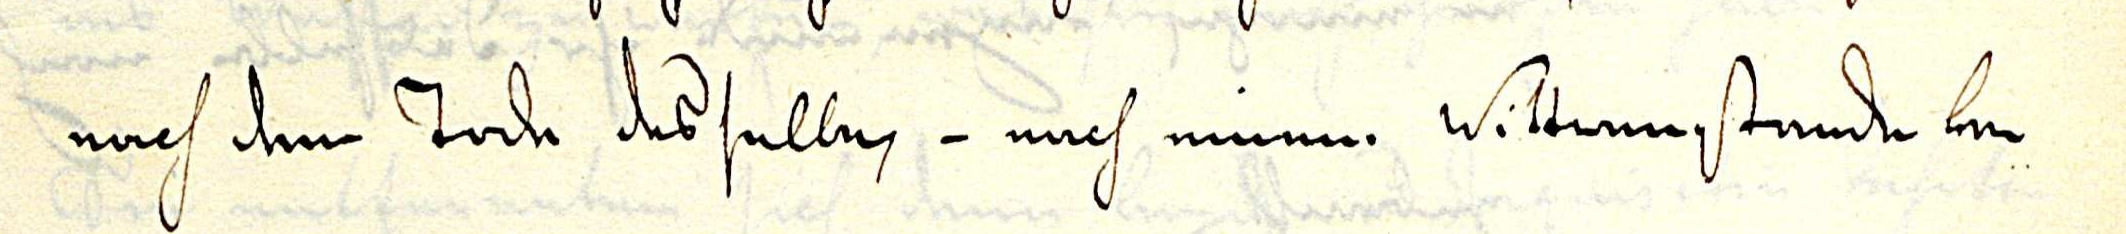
nach dem Tode desselben – nach einen Wittwenstande von
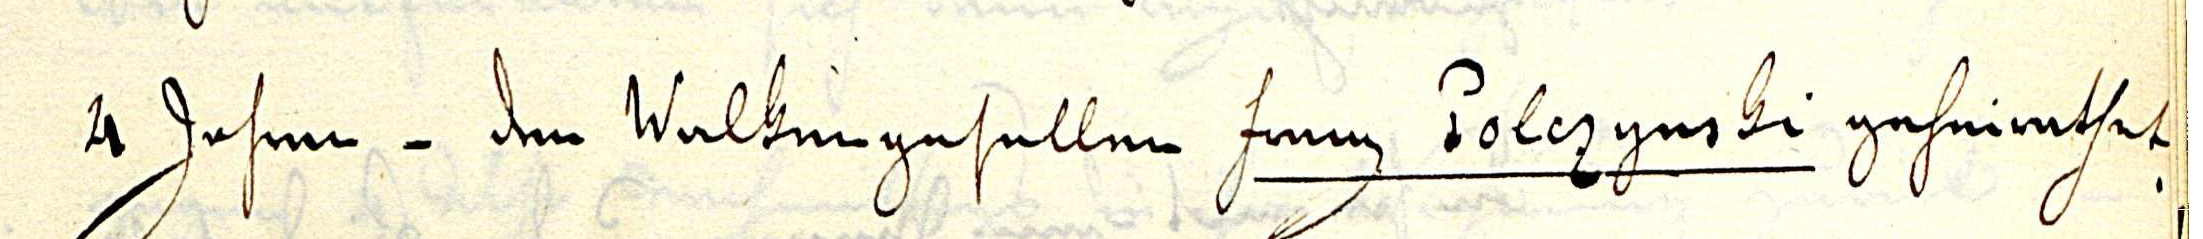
4 Jahren – den Walkengeselle Franz Polczynski geheirathet
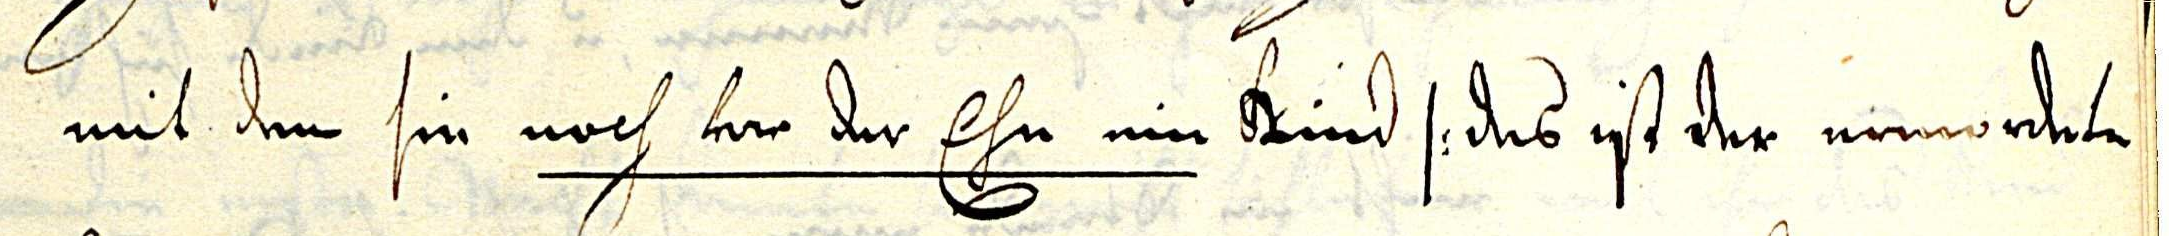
mit dem sie noch vor der Ehe ein Kind (das ist der ermordete
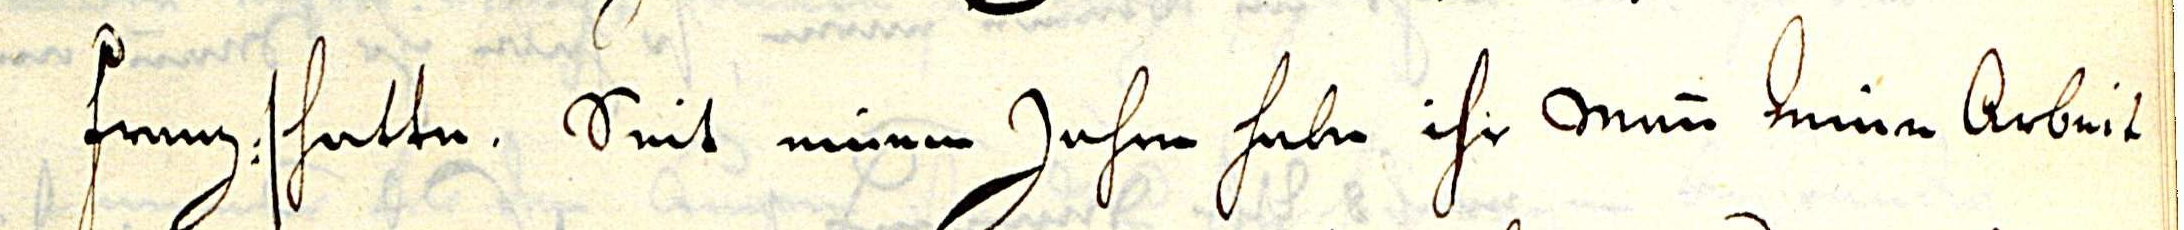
Franz) hatte. Seit einem Jahr habe ihr Mann keine Arbeit
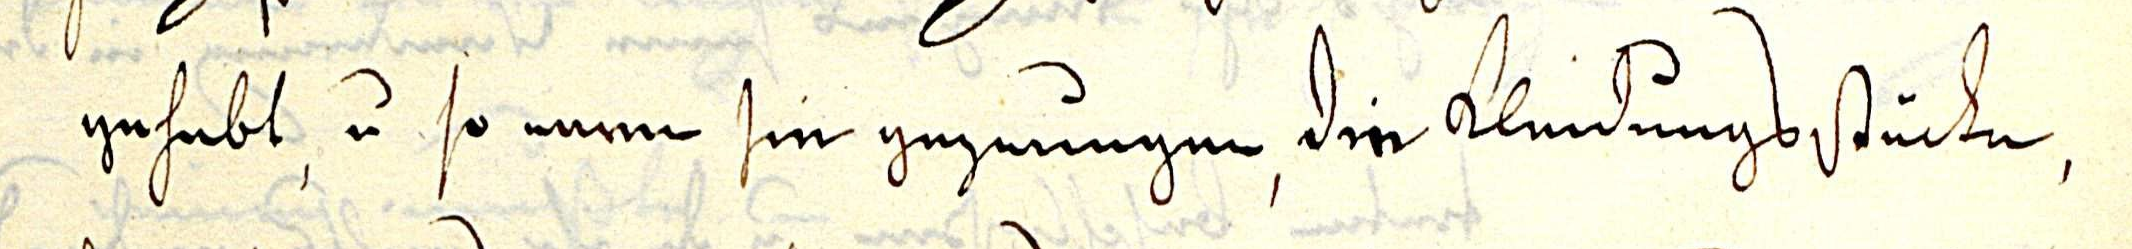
gehabt, u so waren sie gezwungen, die Kleidungsstücke,
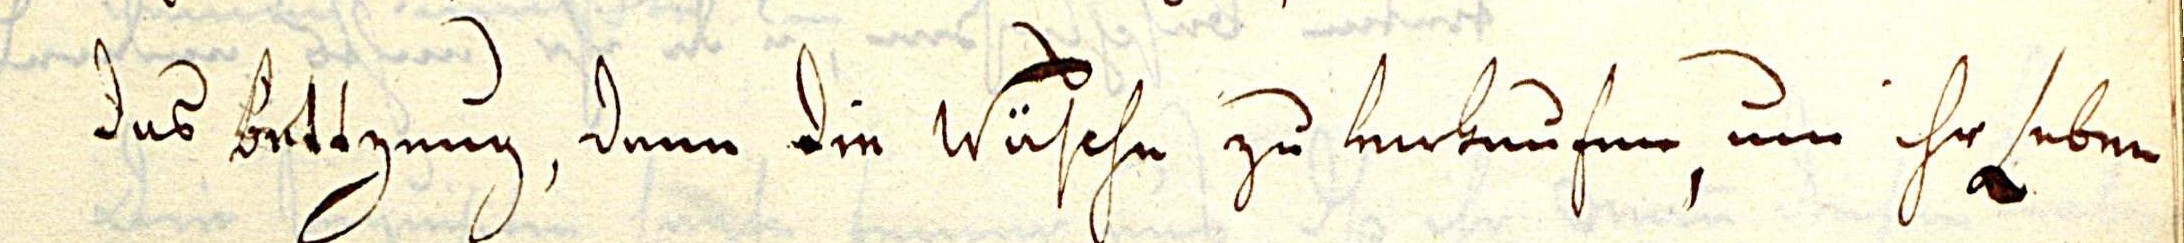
das Bettzeug, den die Wäsche zu verkaufen, um ihr Leben
